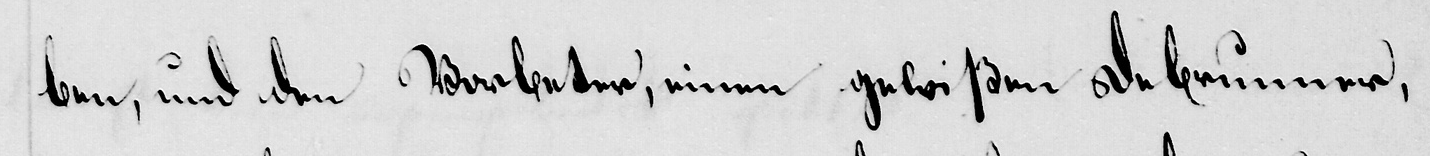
ben, und den Vorbeter, einen gewißen Debrunner,
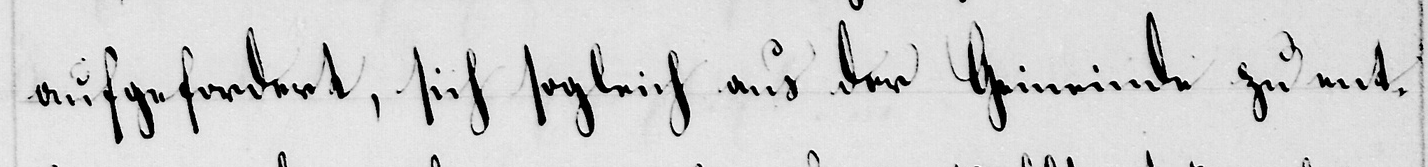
aufgefordert, sich sogleich aus der Gemeinde zu ent¬
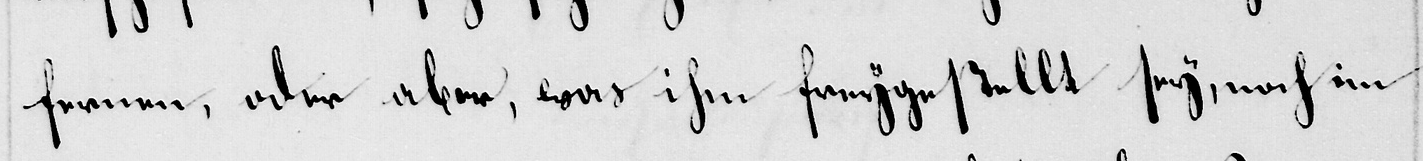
fernen, oder aber, was ihm freygestellt sey, noch im
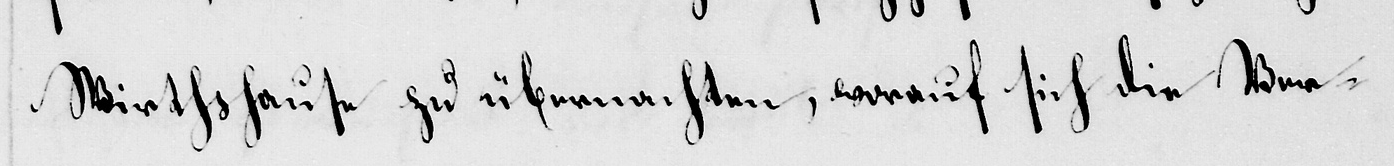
Wirthshause zu übernachten, worauf sich die Ver¬
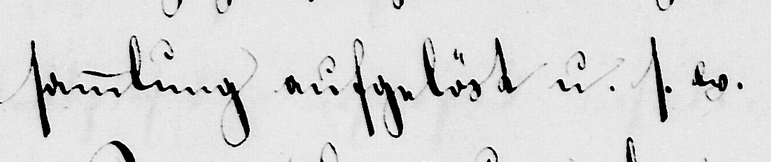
sammlung aufgelöst u. s. w.
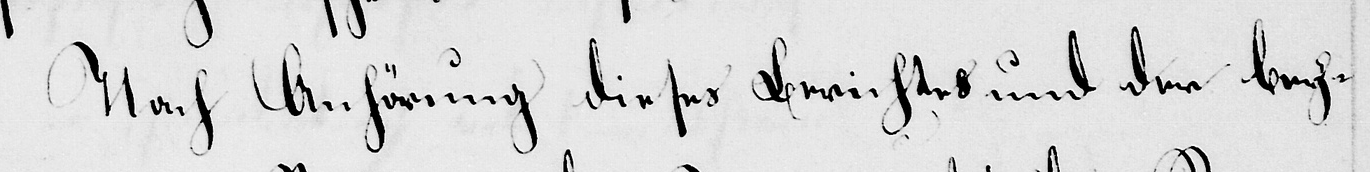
Nach Anhörung dieses Berichtes und der bey¬
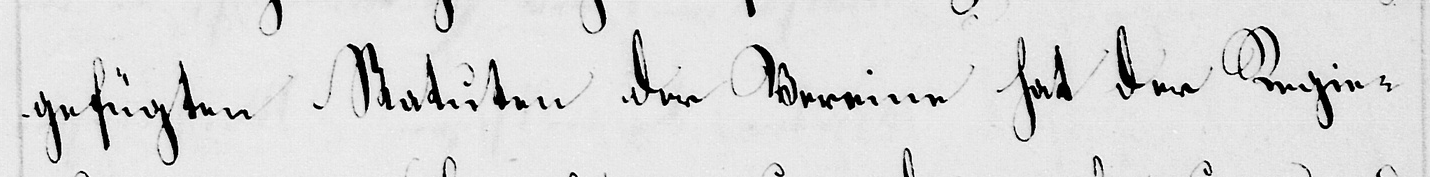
gefügten Statuten der Vereine hat der Regie¬
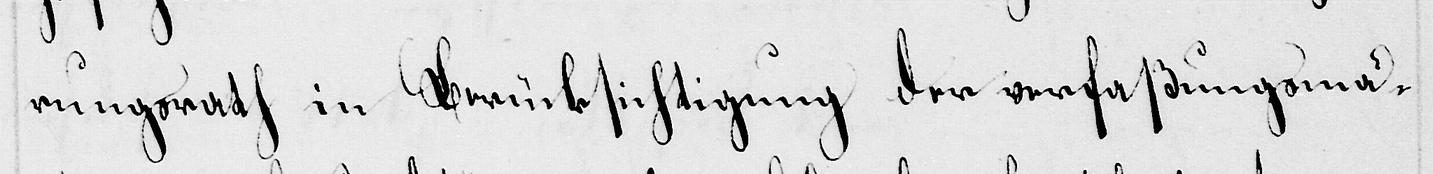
rungsrath in Berücksichtigung der verfaßungsmä¬
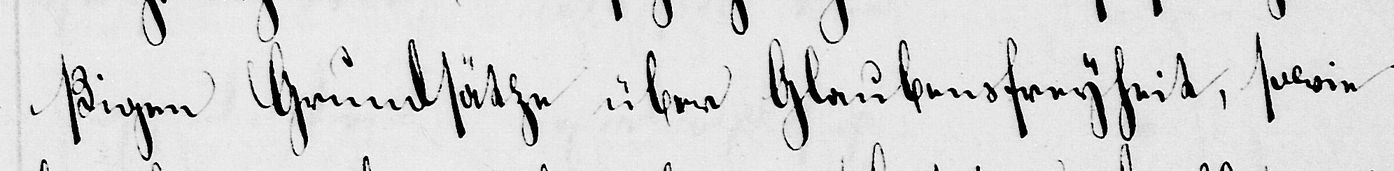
ßigen Grundsätze über Glaubensfreyheit, sowie
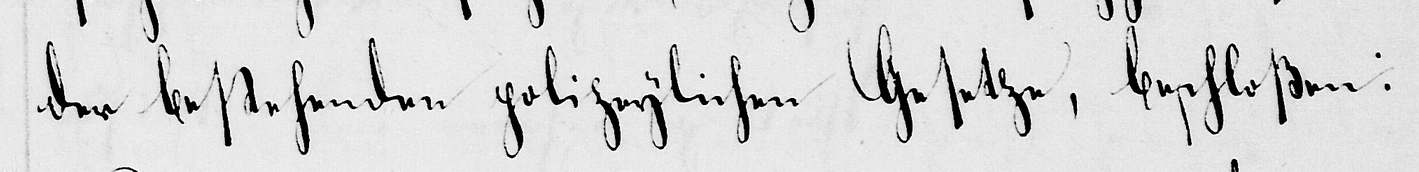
der bestehenden polizeylichen Gesetze, beschloßen:
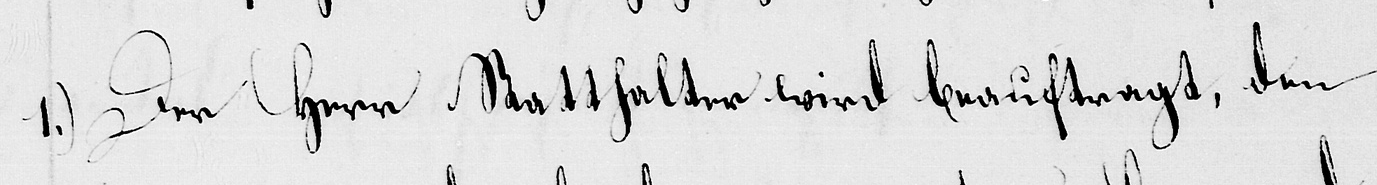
1.) Der Herr Statthalter wird beauftragt, den
